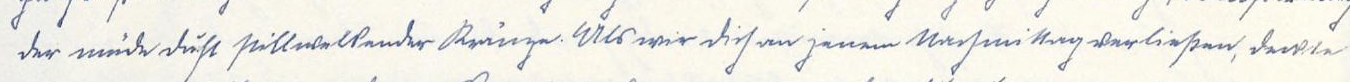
der milde Duft stillwelkender Kränze. Als wir dich an jenem Nachmittag verließen, deckte
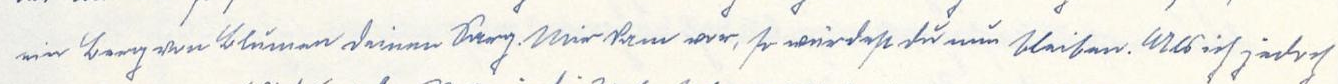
dein Berg von Blumen deinen Sarg. Mir kam vor, so würdest du bleiben. Als ich jedoch
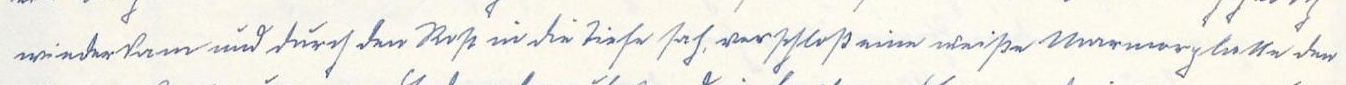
wiederkam und durch den Rost in die Tiefe sah, verschloß eine weiße Marmorplatte den
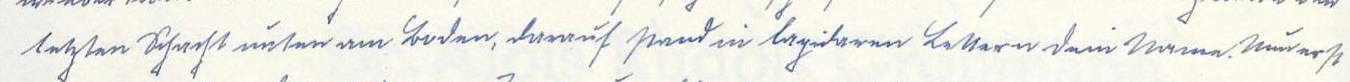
letzten Schacht unten den am Boden. Darauf stand in lapidaren Lettern dein Name. Nun erst
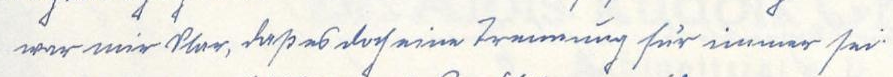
war mir klar, daß es doch eine Trennung für immer sei.
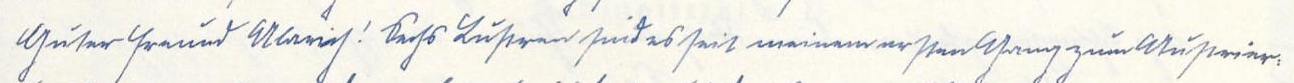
Guter Freund Alarich! Sechs Lustren sind es seit meinem ersten Gang zum Austrier-
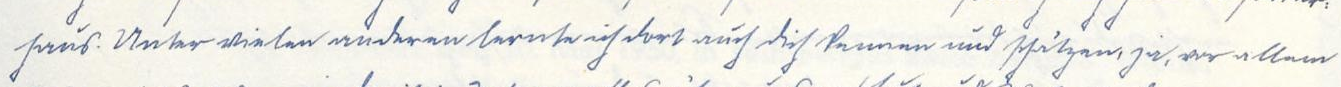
haus. Unter vielen anderen lernte ich dort auch dich kennen und schätzen, ja, vor allem
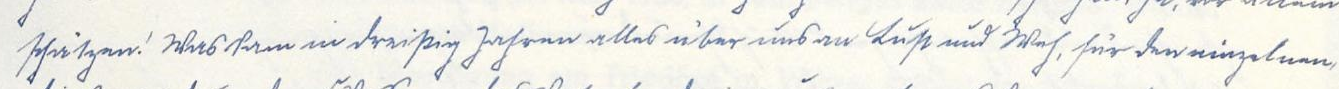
schätzen! Was kam in dreißig Jahren alles über uns an Lust und Weh, für den einzelnen,
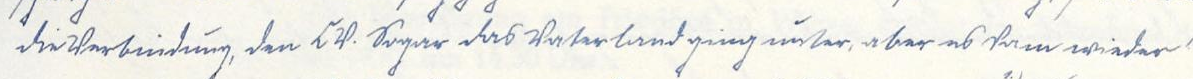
die Verbindung, den CV. Sogar das Vaterland ging unter, aber es kann wieder!
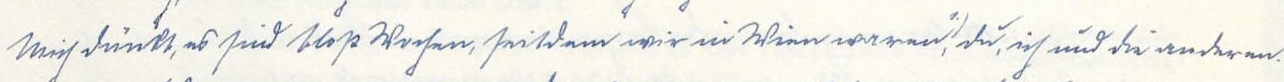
Mich dünkt, es sind bloß Wochen, seit dem wir in Wien waren, 1) du, ich und die anderen.
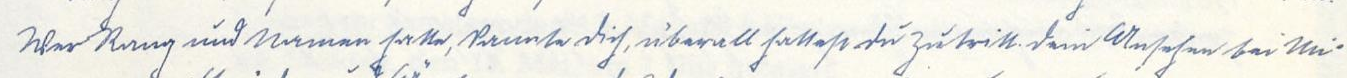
Wer Rang und Namen hatte, kannte dich, überall hattest zu Zutritt. Dein Ansehen bei Mi-
